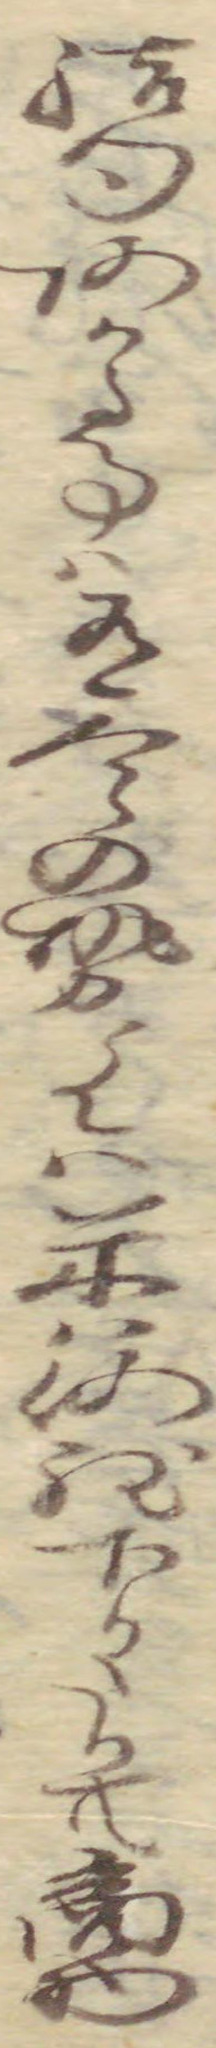結句あかる事は有今の勢ニては米は何程下りたり共商物
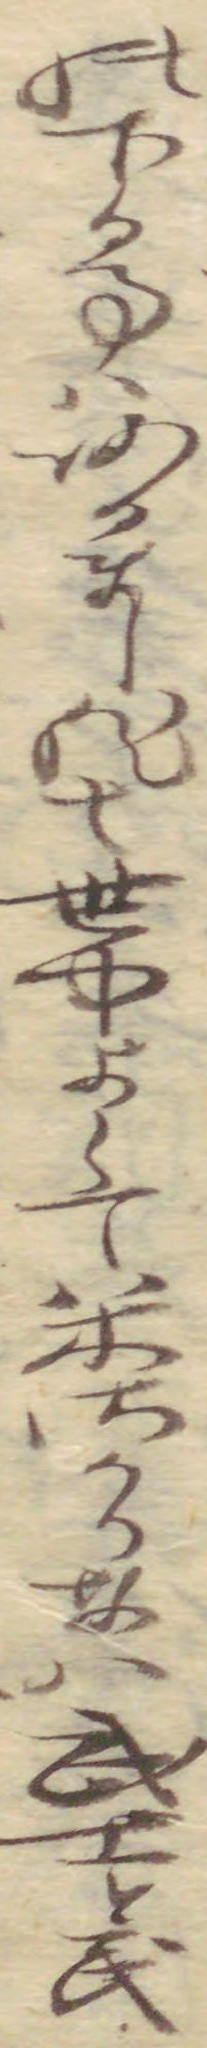の下る事はあるまし然は世中よくて米さかりなは武士と民
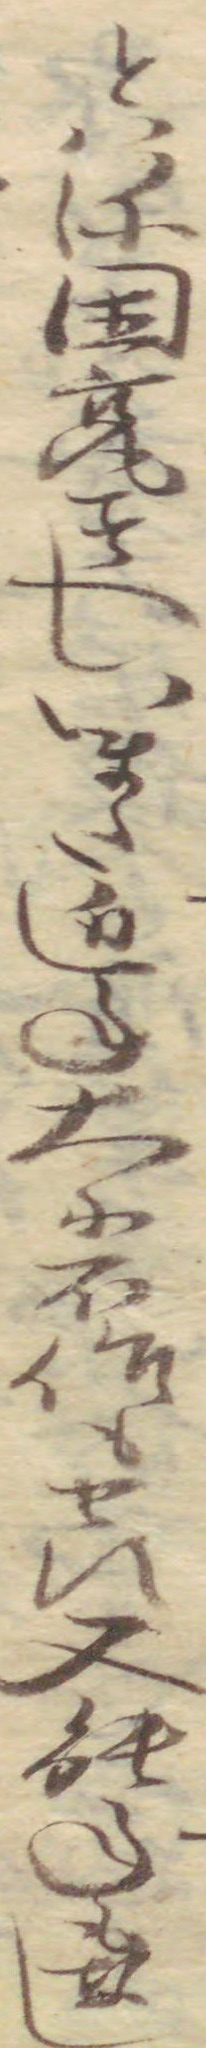とは弥困窮すへしいまた近年大に不作もせす又能年もなし
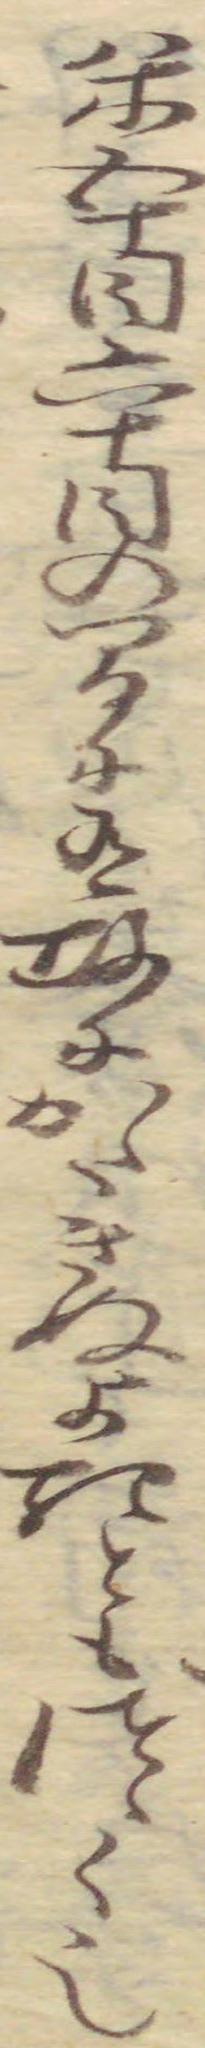米五十目六十目の間に有故にかたきぬよきともつゝく也
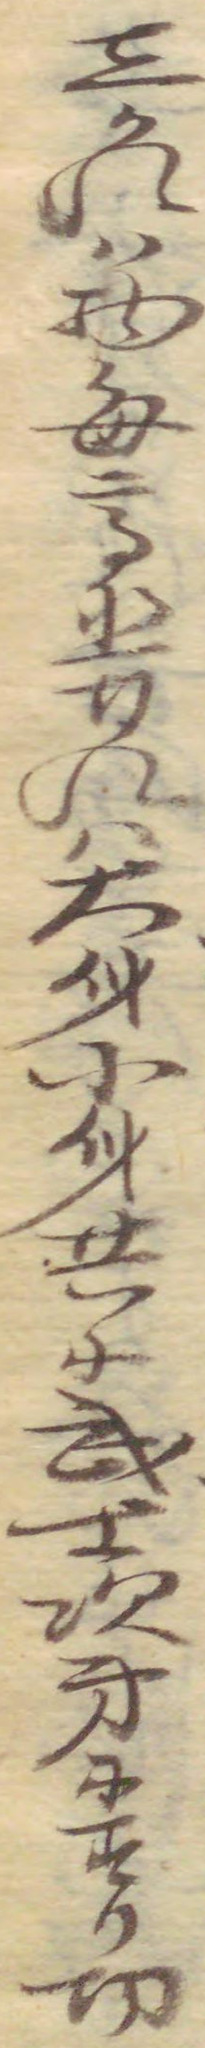しかれは物毎高直なれは大身小身共に武士次第にすり切

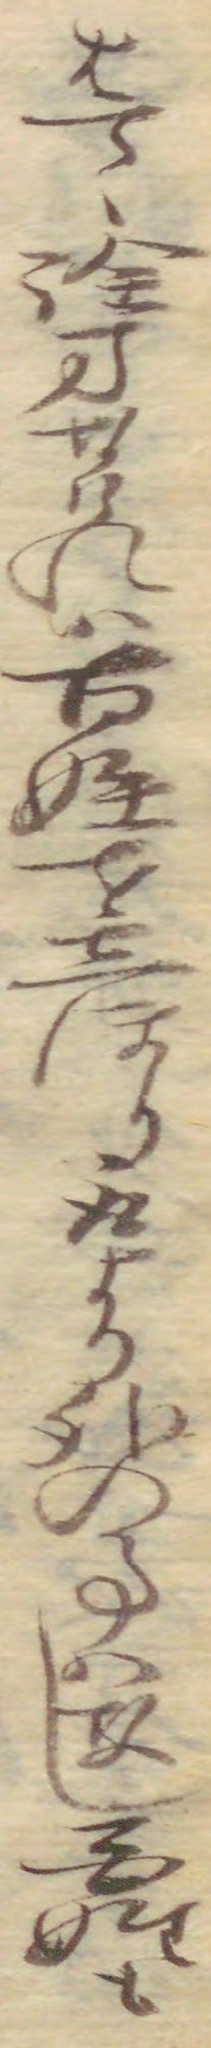はてゝ詮方なけれは百姓をしほり取より外の事はなし百姓も
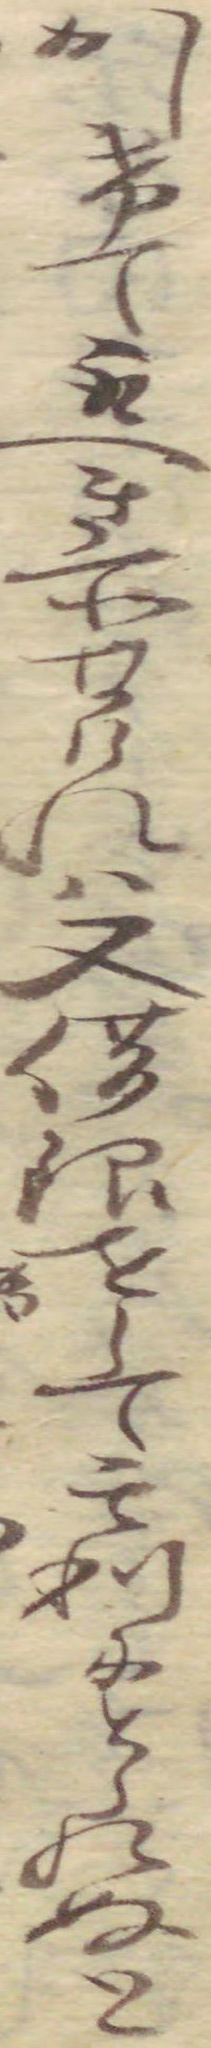かしけて取へき処なけれは又借銀をして其利にとられぬと
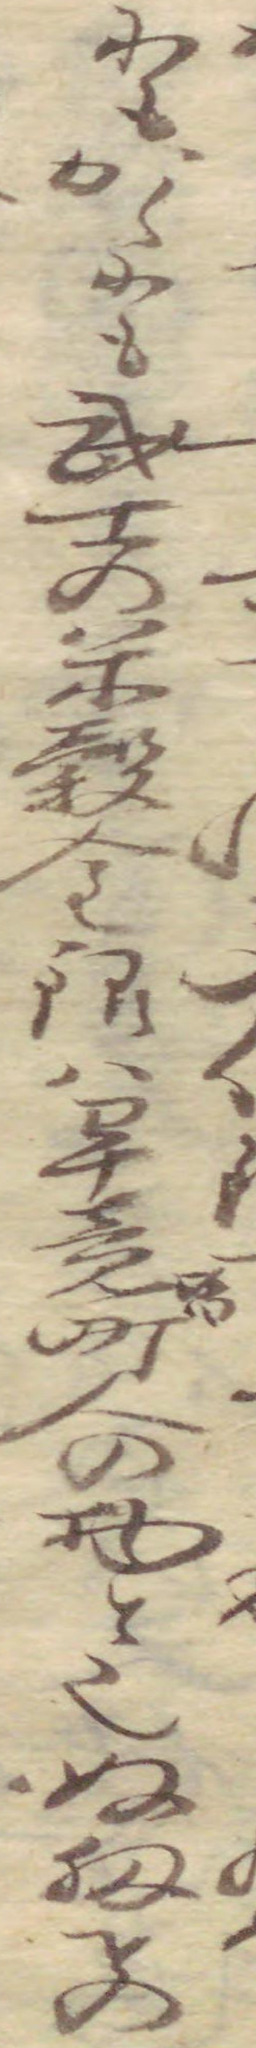にもかくにも武士の米穀金銀は畢竟皆町人の物と也ぬ扨その
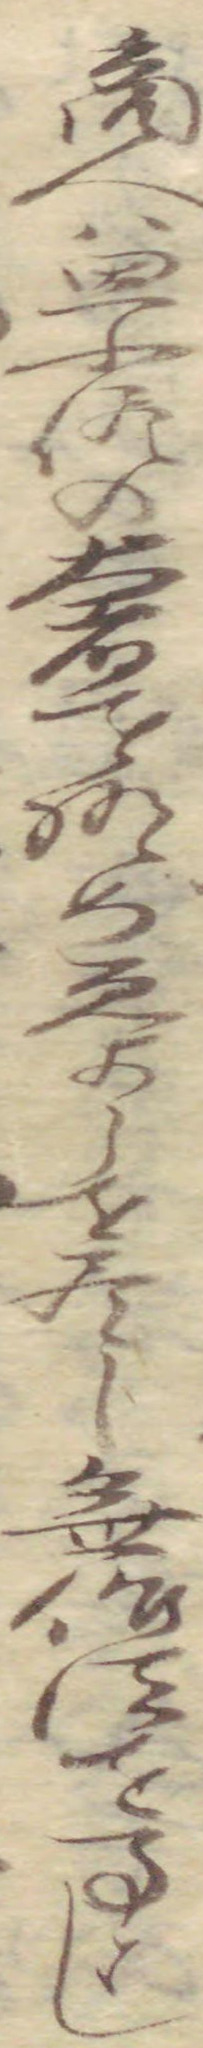商人は思ふ侭の奢を極めゑようを尽し不作法を事とし
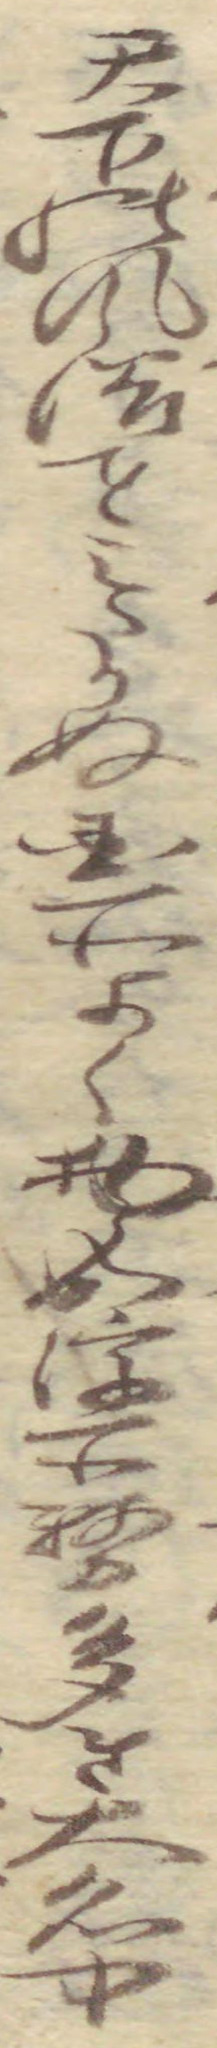天下の風俗をみたりぬ国所よく物成浮所務多き大名中
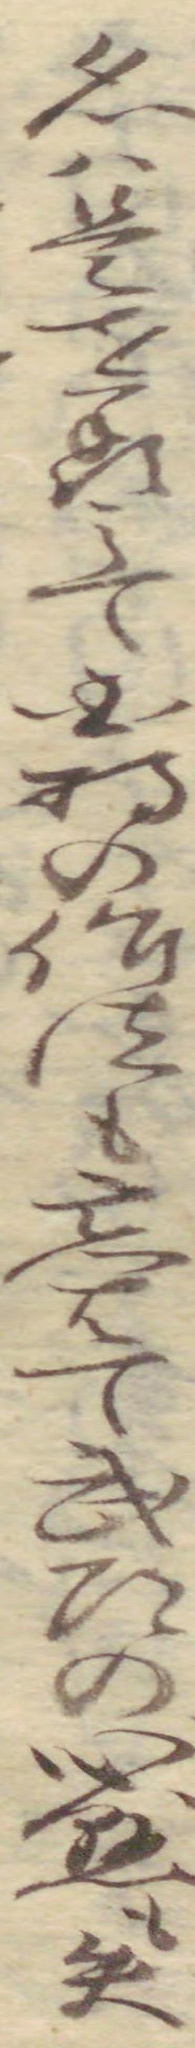名は是を羨みて国持の作法も忘はて武道の心懸も失
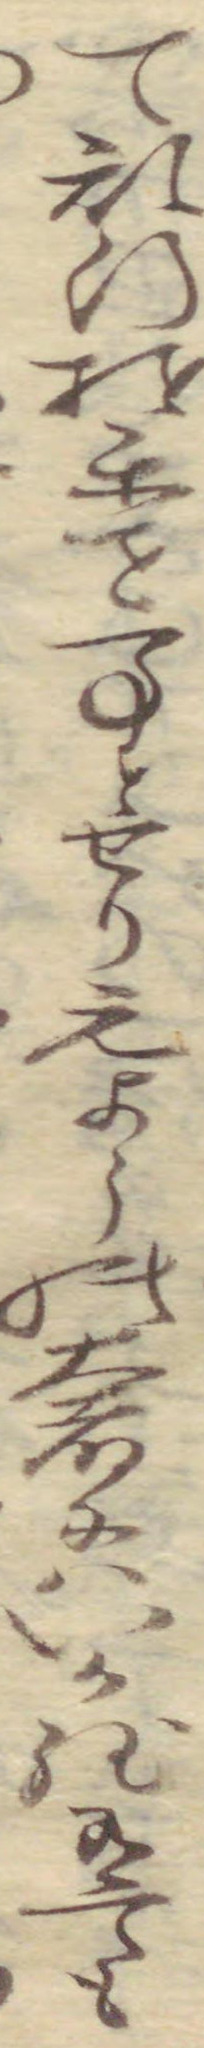て乱行遊楽を事とせりえようの奢にはいか程有ても
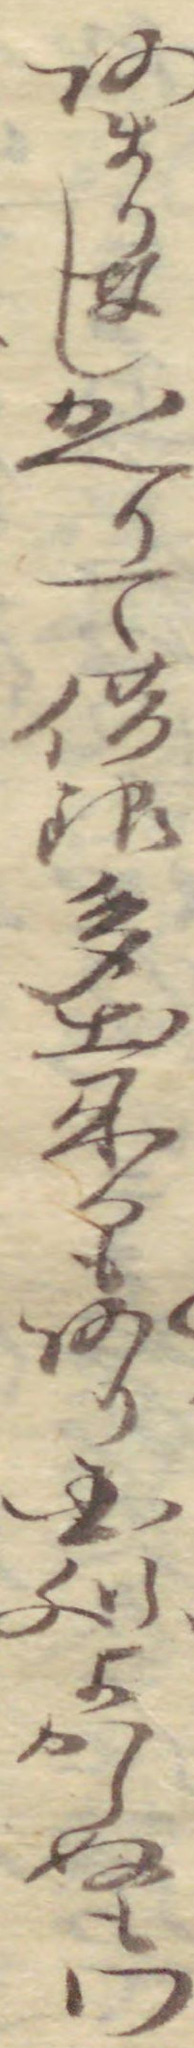あまりなしかへりて借銀多出来るもあり国処よからぬもわ
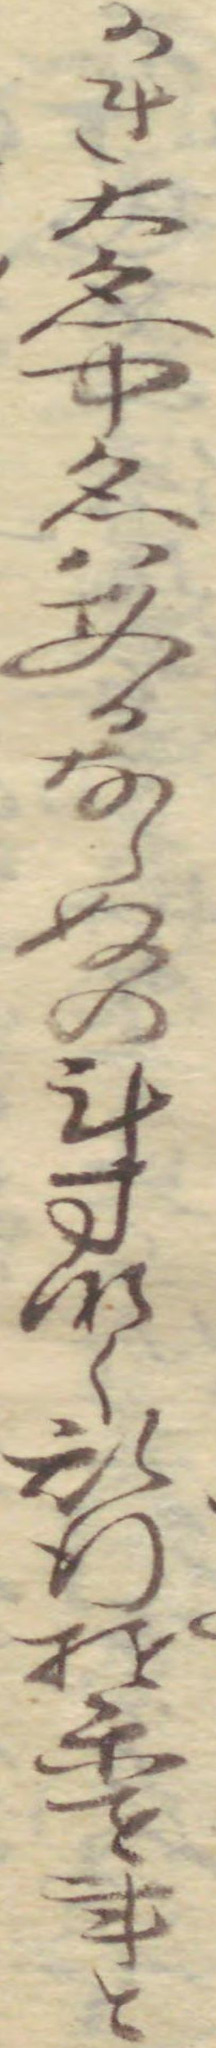かき大名中名はなるならぬの計方なく乱行遊楽を事と
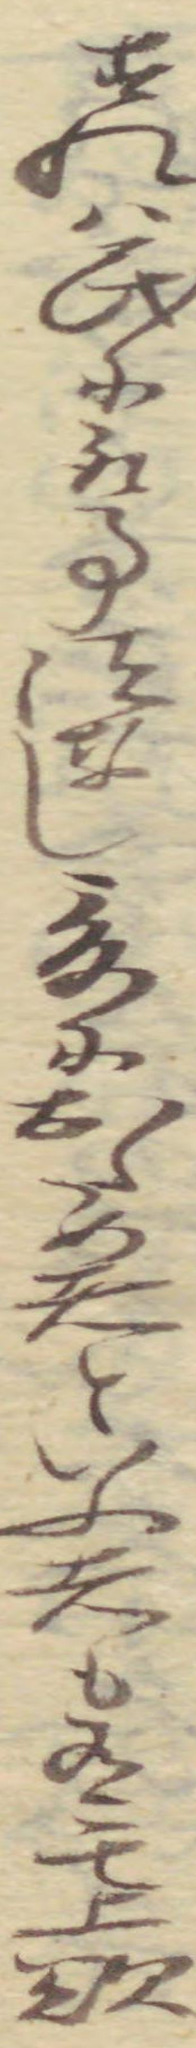すれは民に取事法なし爰におため者といふ者も有其上欲
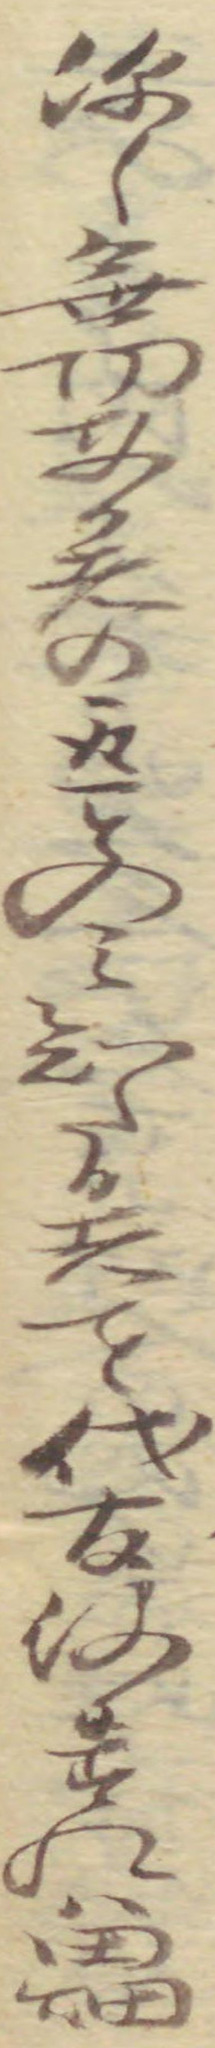深く無功なる者の取ことのみ知たる者を代官役？にすれは田畑
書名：鶯宿雑記. 巻263-264
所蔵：国立国会図書館 National Diet Library, JAPAN
